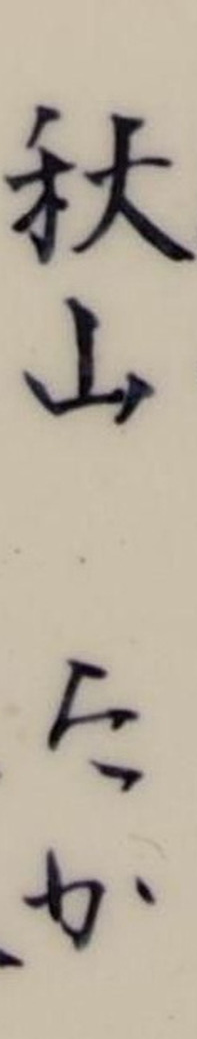秋山たか
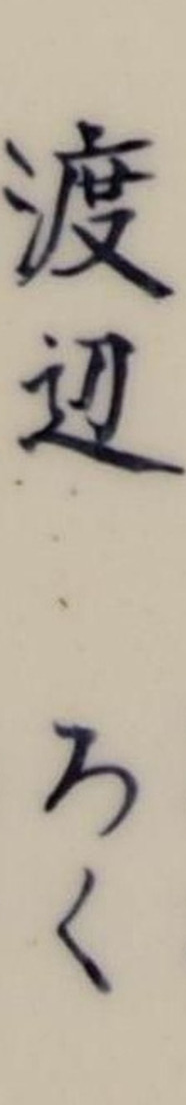渡辺ろく
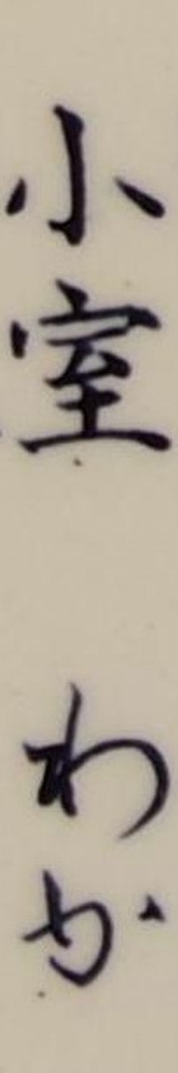小室わか
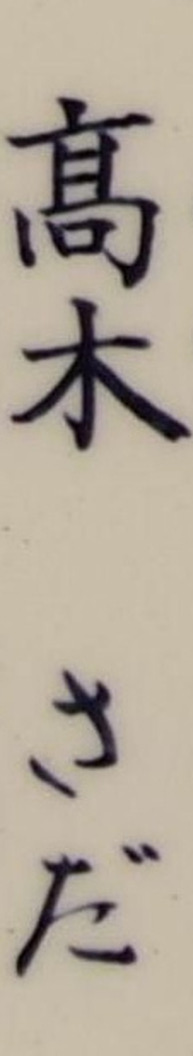高木さだ
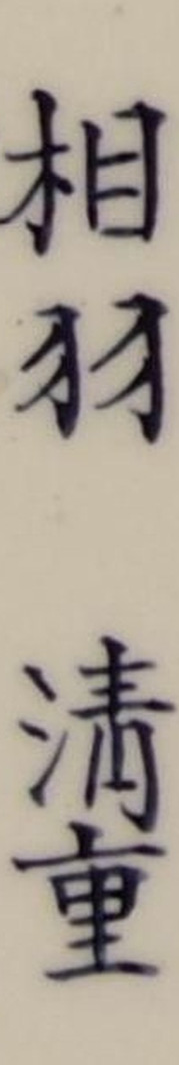相羽清重
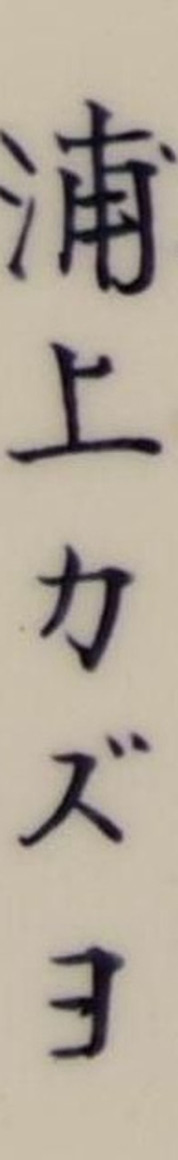浦上カズヨ
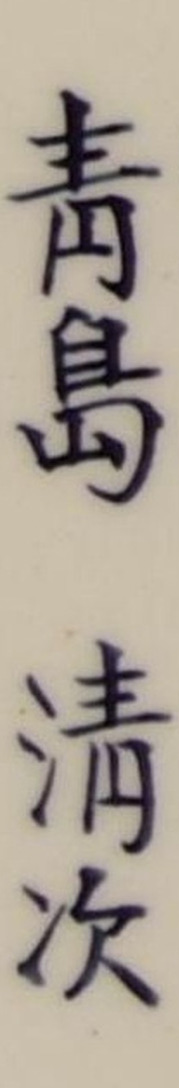青島清次
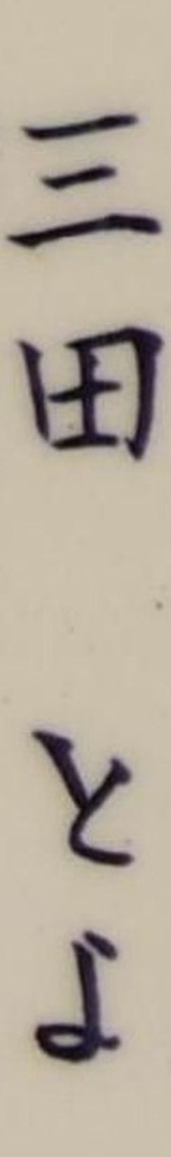三田とよ
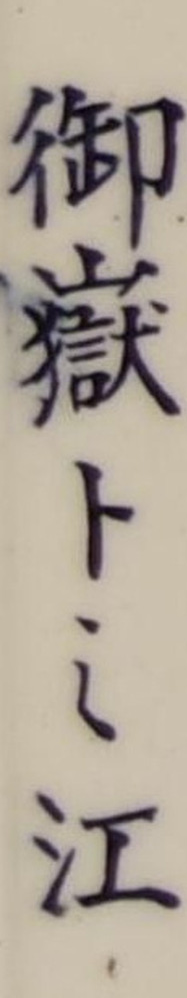御嶽トミ江

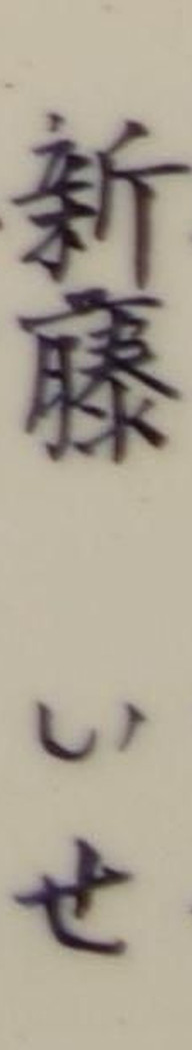新藤いせ
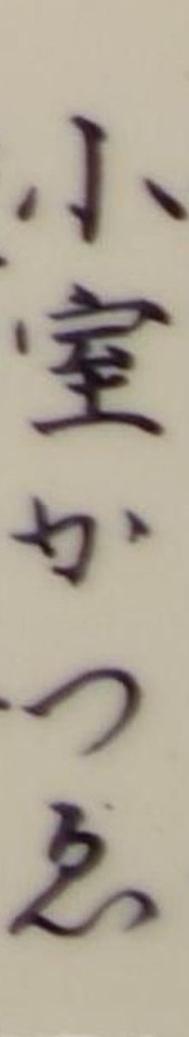小室かつゑ
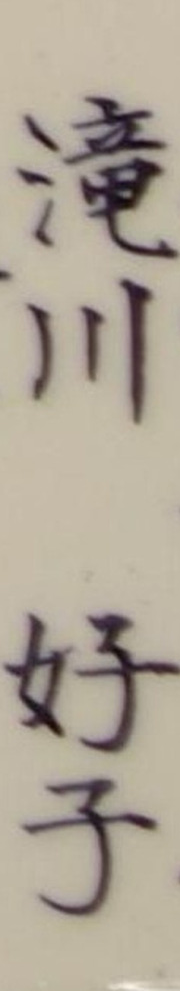滝川好子
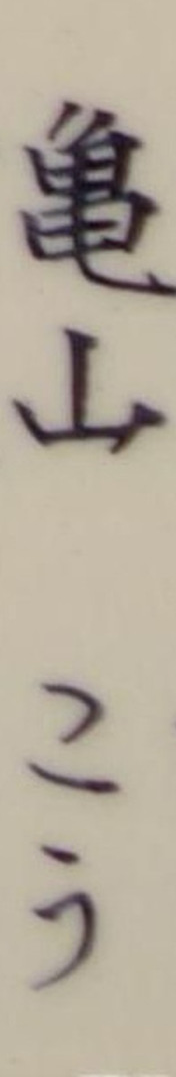亀山こう
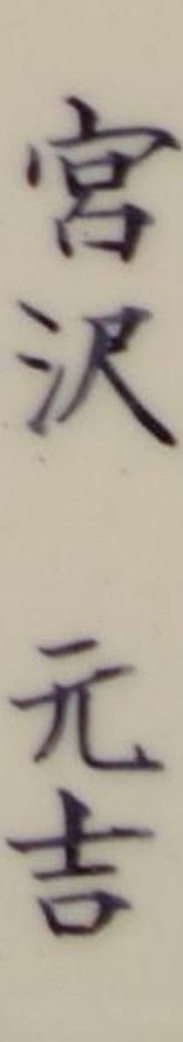宮沢元吉
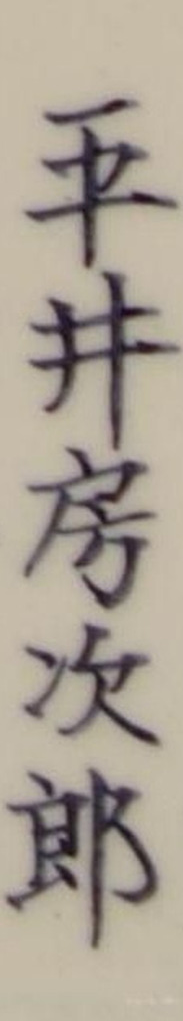平井房次郎
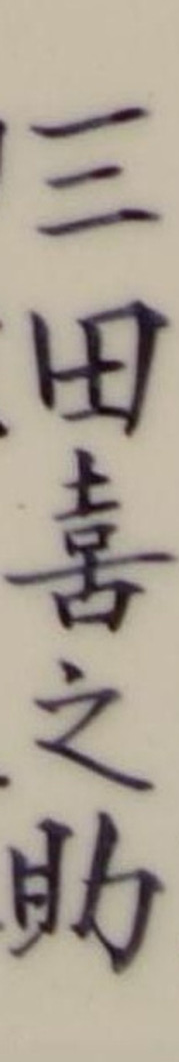三田喜之助
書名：E~L
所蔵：高野山金剛峯寺
